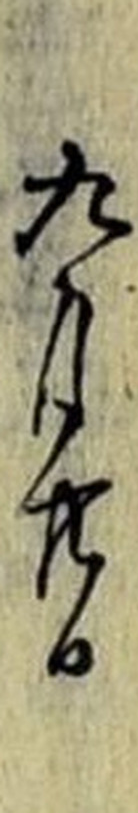九月廿日
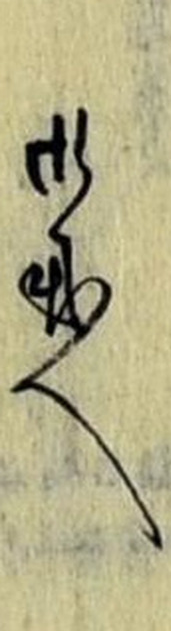御用人
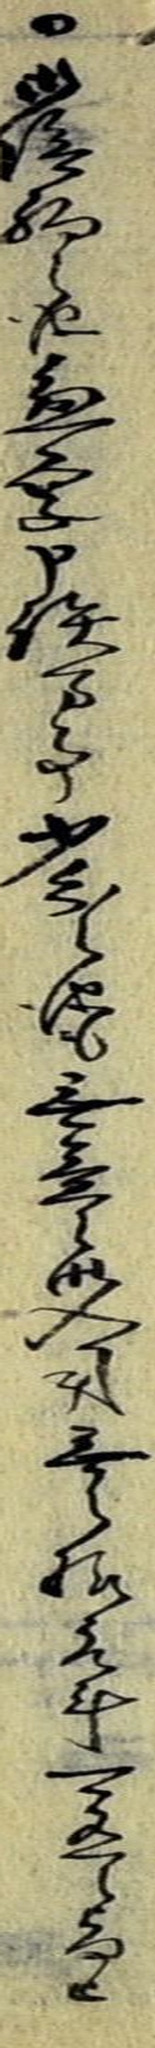○御倹約之儀愈厚申談万事少分之儀も無益之御入用無之様取斗可有之旨被
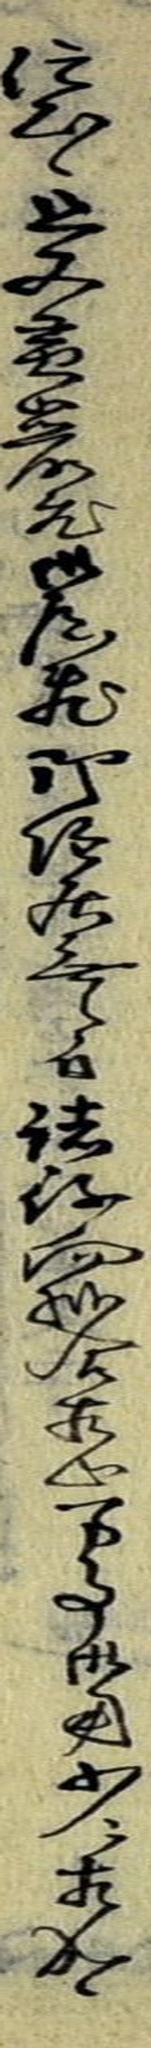仰出候且又費厳敷御屋敷御住居無之に付諸役向掛合相止万事御用少に相成候
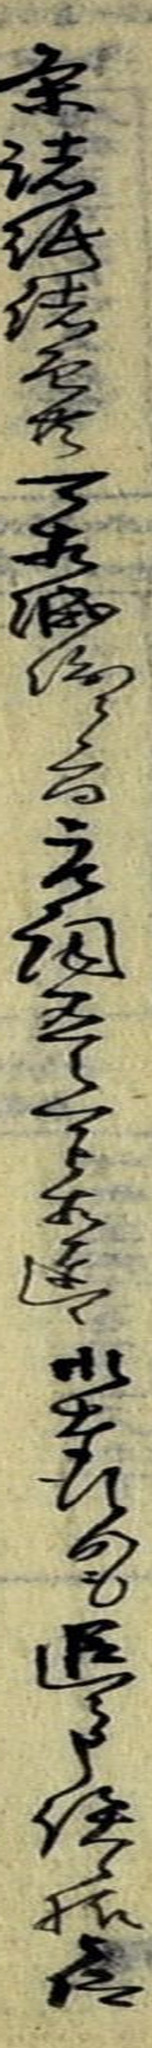条諸紙諸具共可相減儀に候間取調有之可被相達候御奉行ゟも追々申談候様被仰
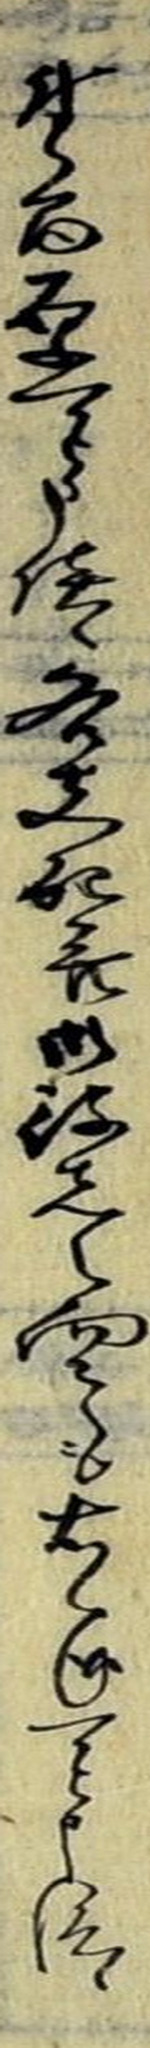付候間厚可被申談候各支配并御役先之面々へも右之趣可被申渡候
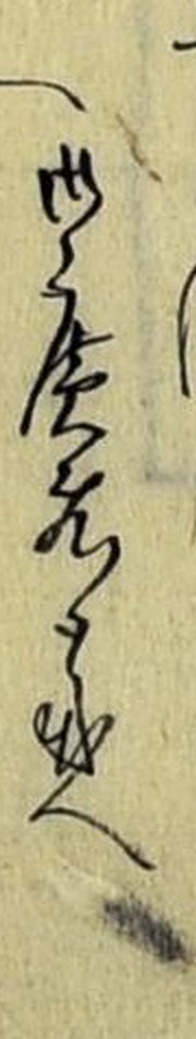御広敷御用人
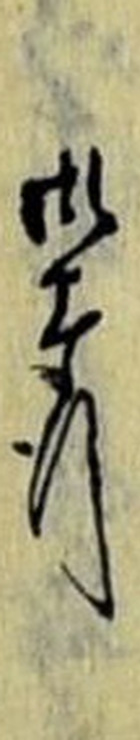御奉行
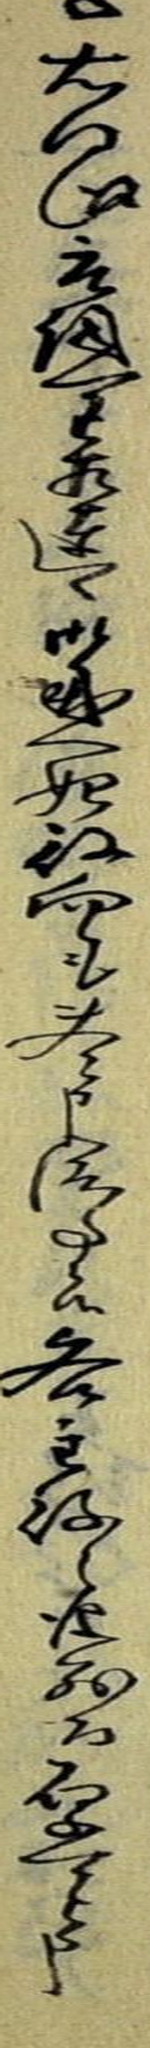○右同趣取調可被相達候御用人始役向へも夫々申渡事に候各主役之儀別而厚可被申
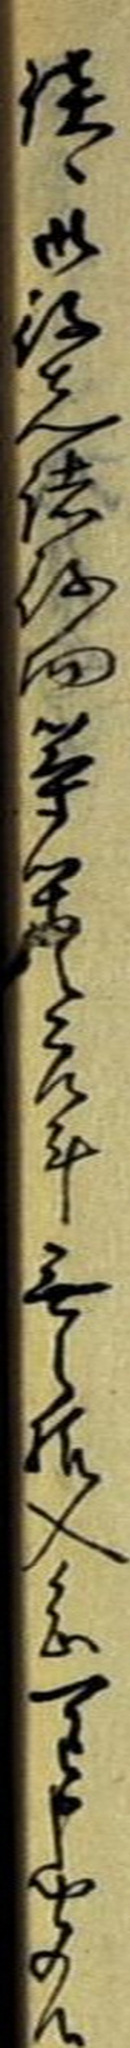談候御役先諸役向等閑に取斗無之様入念可被申聞候
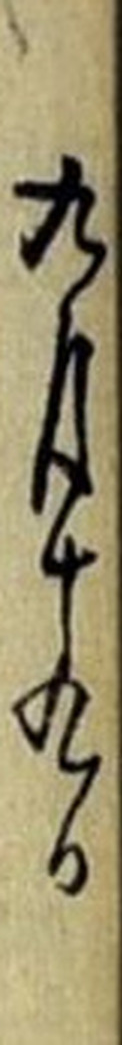九月十九日
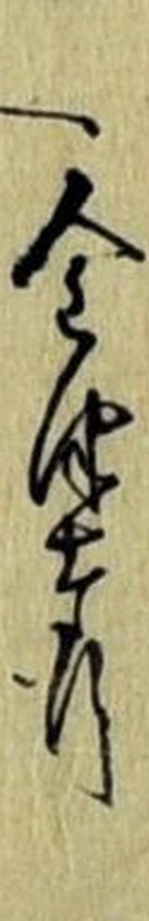金津奉行
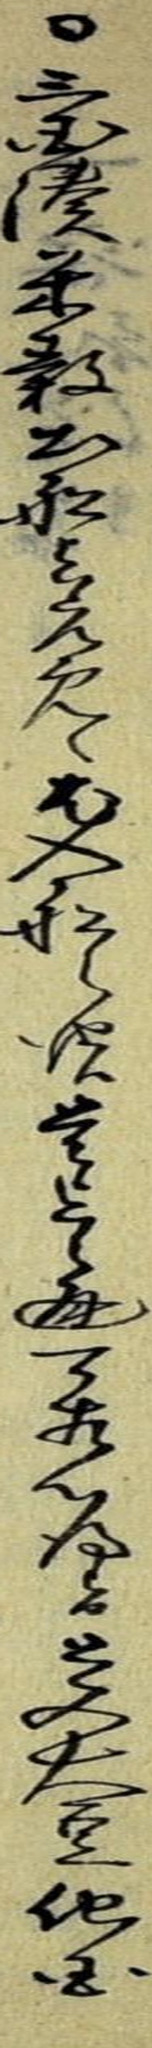○三国湊米穀出船指免候尤入船之儀は是迄之通可相心得旨且又大豆他国
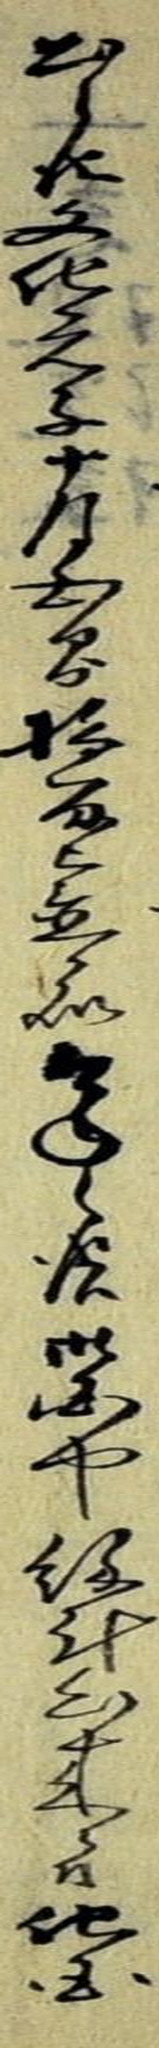出之儀文化元子十月五日ゟ指留被置候処今年之儀は御国中餘計出来候に付他国
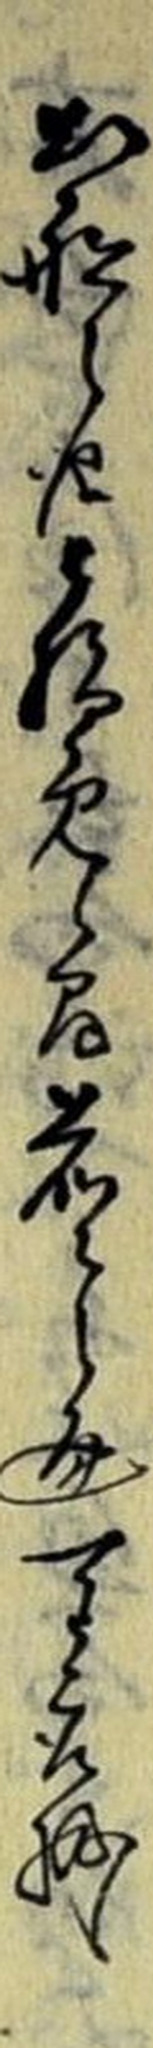出船之儀被指免候間前々之通可被取扱候
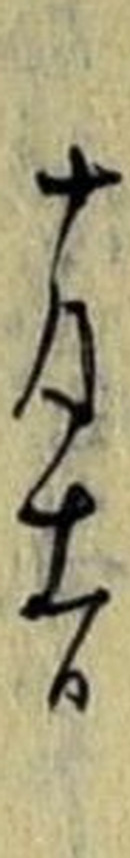十月十一日
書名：命令之部 四
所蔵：福井県文書館 Fukui Prefectural Archives
